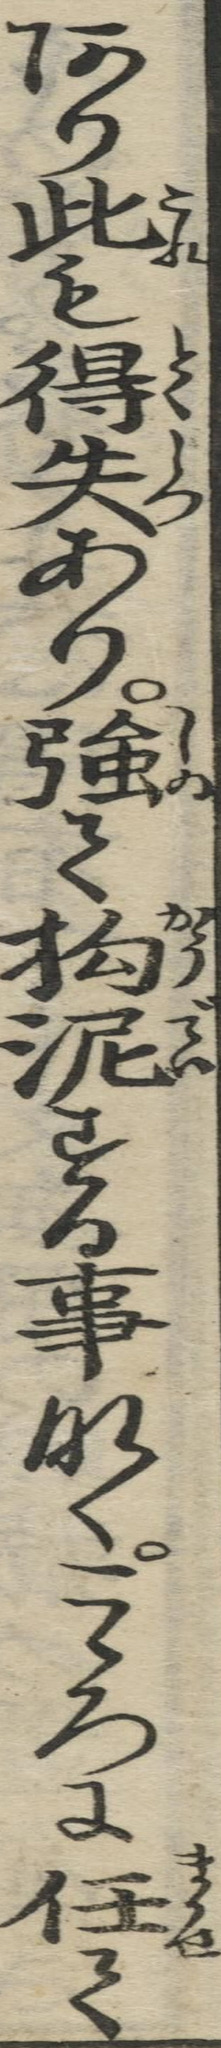あり此も得失あり。強て拘泥する事なく。こゝろに任て
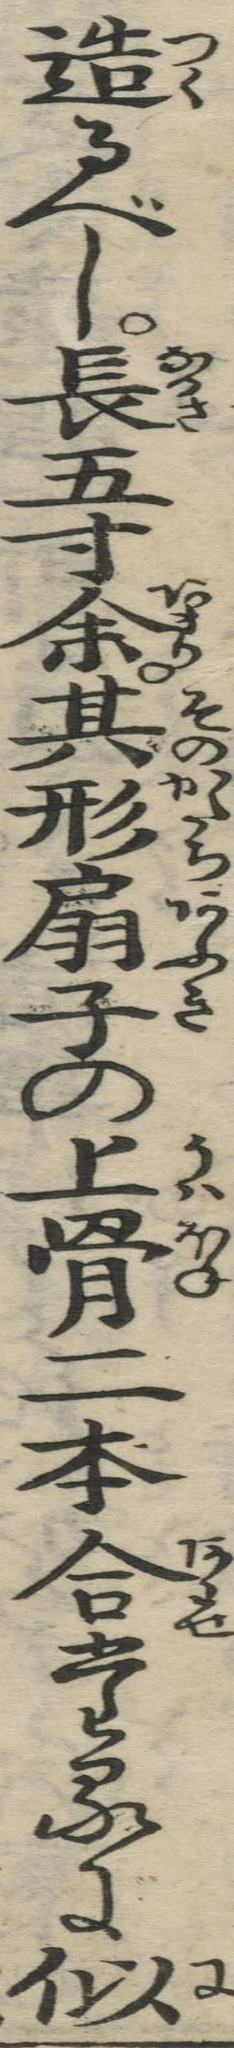造るべし。長五寸余。其形扇子の上骨二本合たるに似
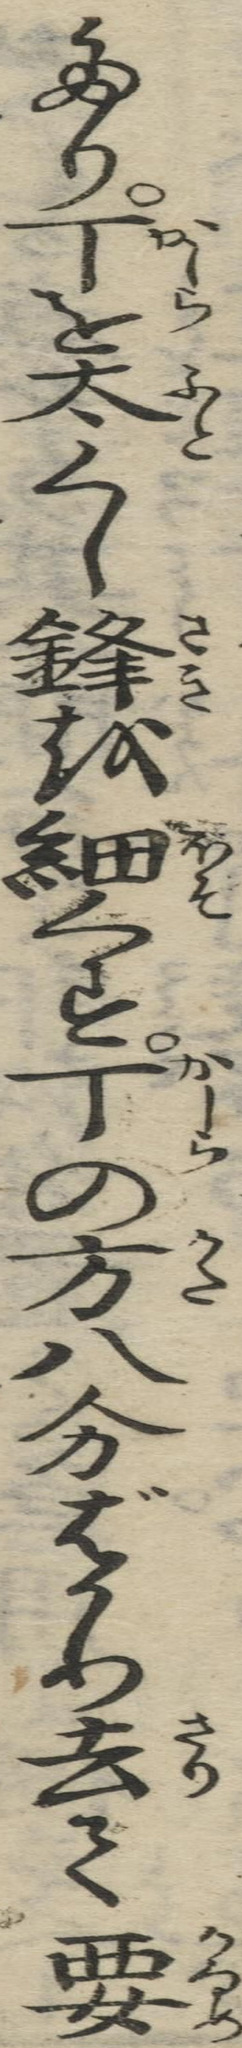たり。丁を太くし鋒を細くす。丁の方八分ばかり去て要
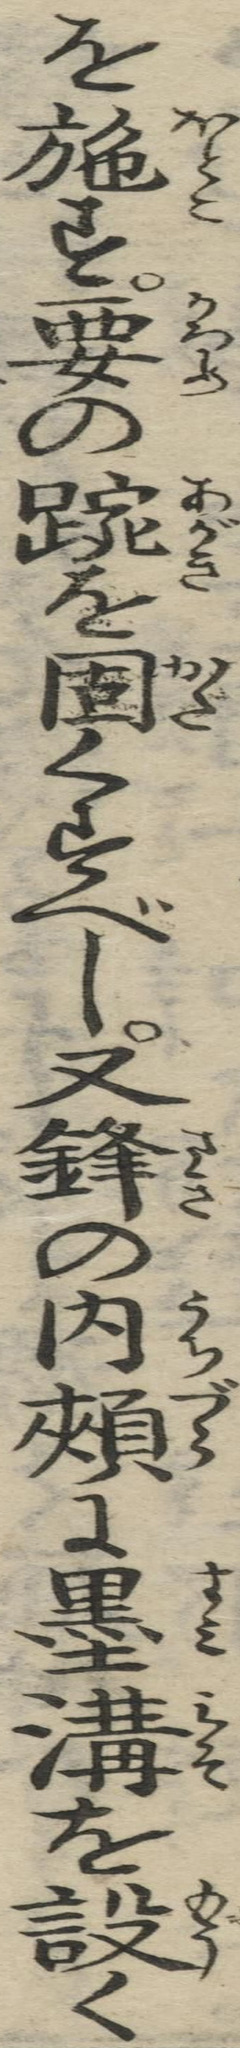を施す。要の踠を固くすべし。又鋒の内頬に墨溝を設く
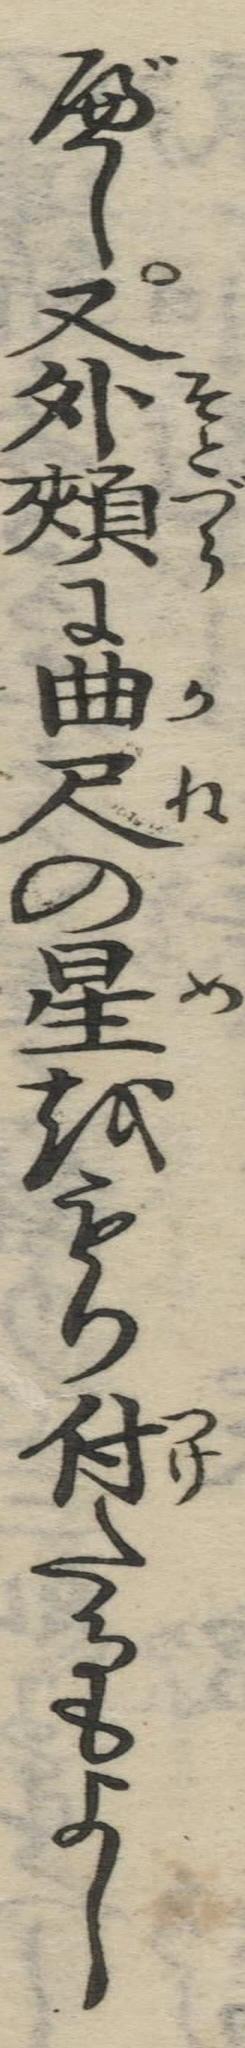べし。又外頬に曲尺の星をもり付たるもよし
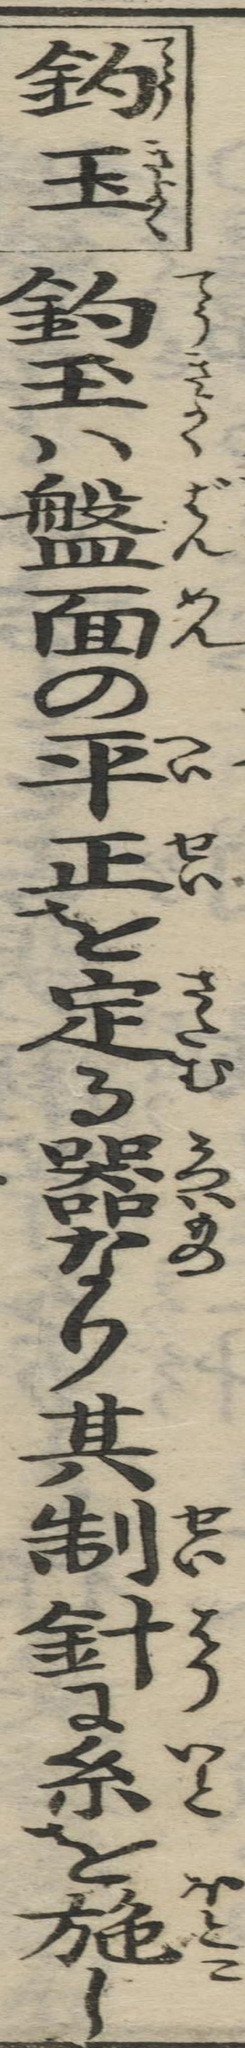釣玉釣玉は盤面の平正を定る器なり其制針に糸を施し
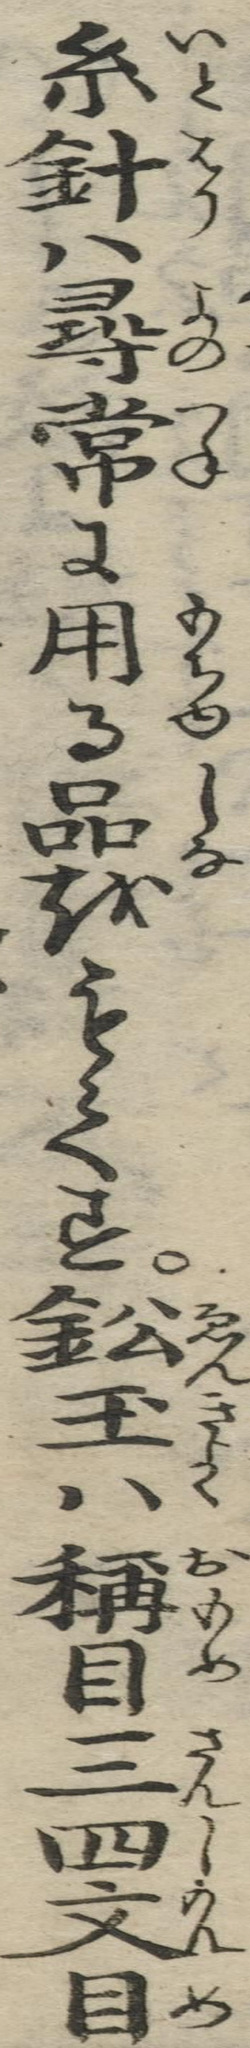糸針は尋常に用る品をもてす。鉛玉は称目三四文目
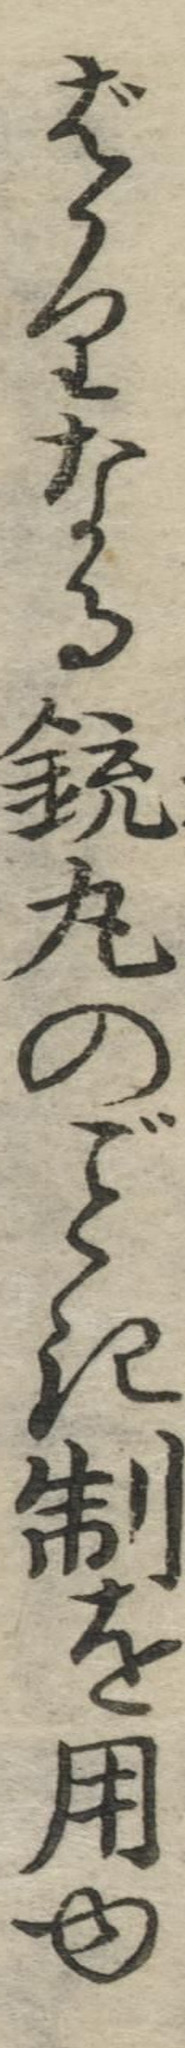ばかりなる銃丸のごとき制を用ゆ
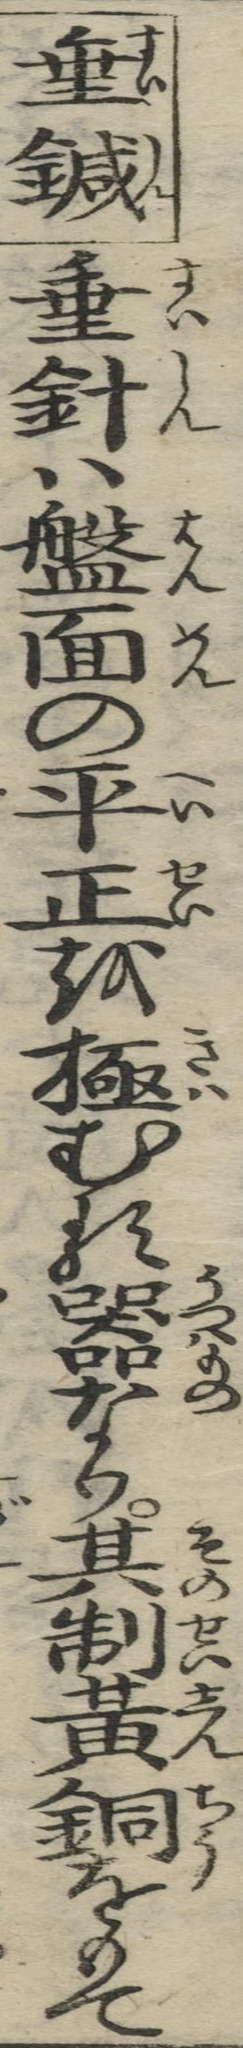垂鍼垂鍼は盤面の平正を極むる器なり。其制黃銅をもて
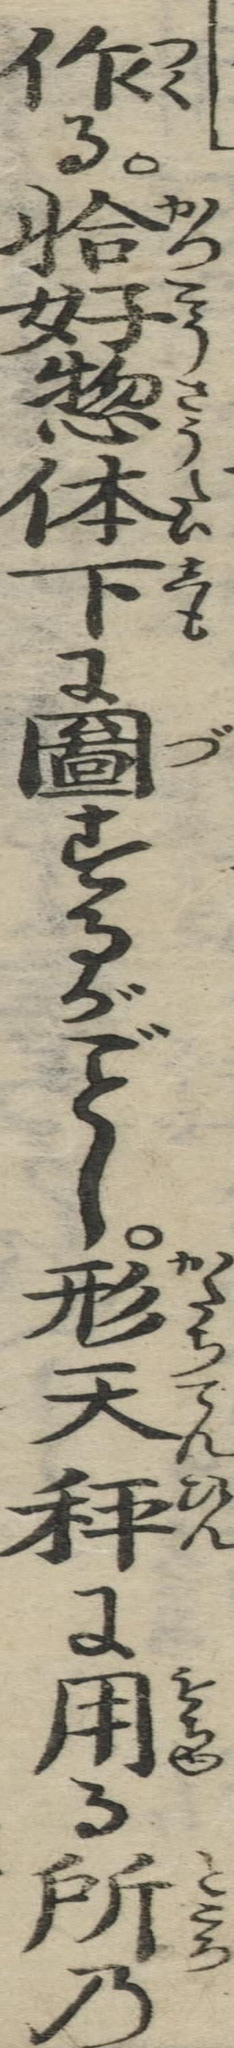作る。恰好惣体下に図するがごとし。形天秤に用る所の
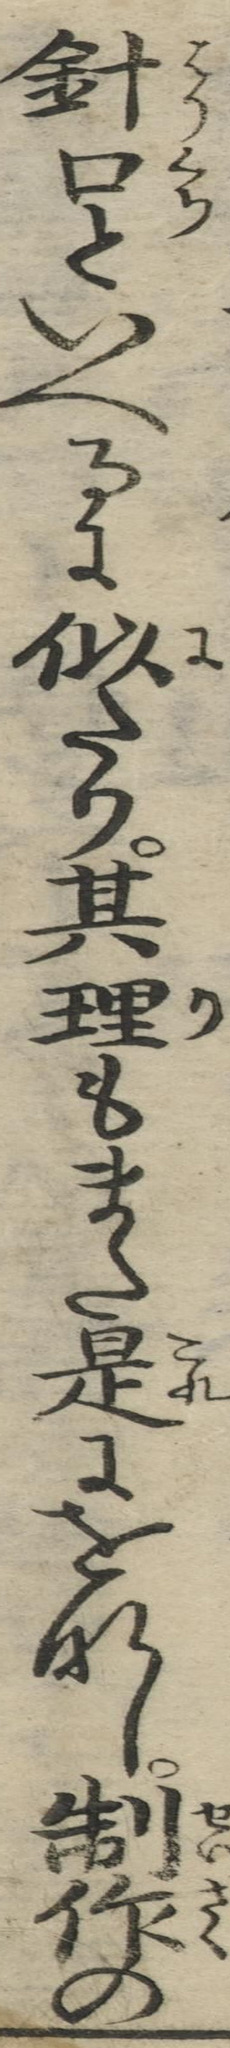針口といへるに似たり。其理もまた是にをなし。制作の

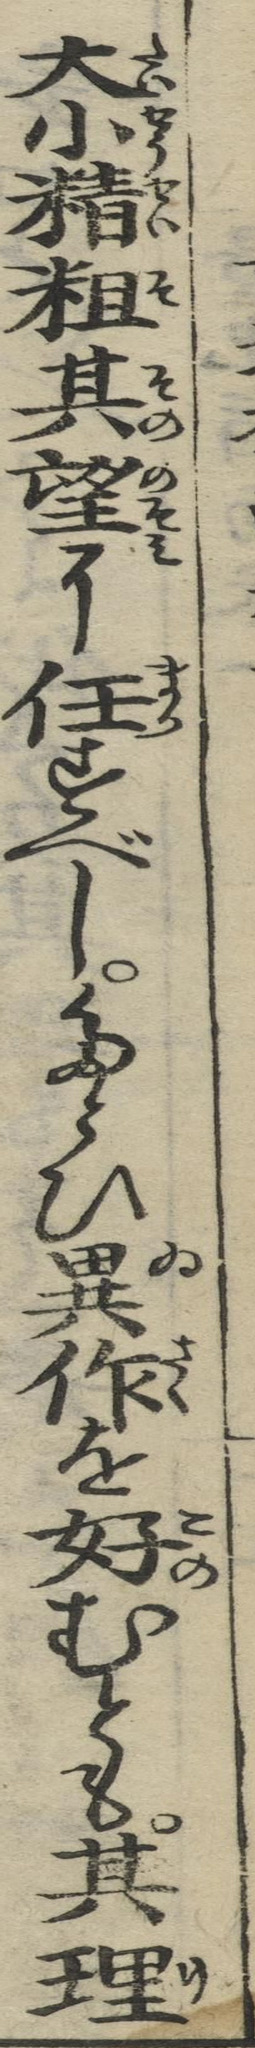大小精粗其望に任すべし。たとひ異作を好むとも。其理
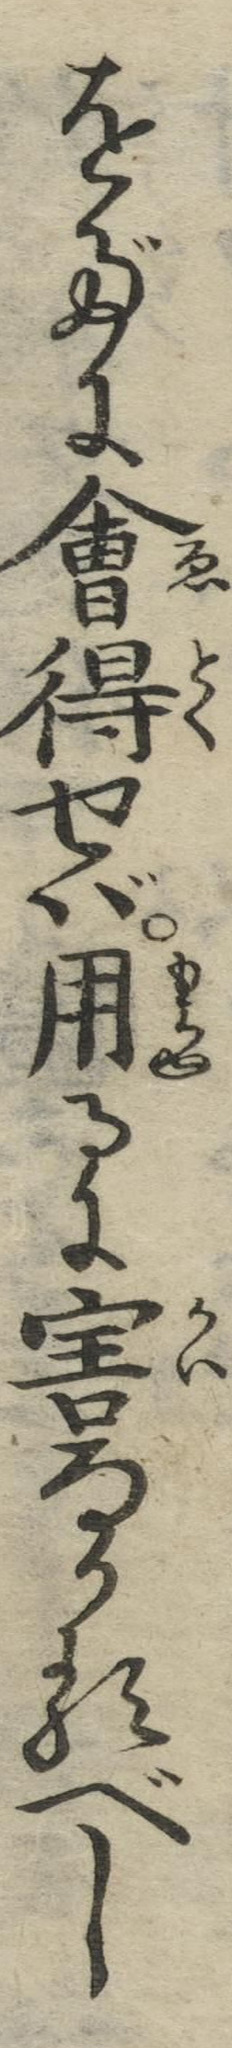をだに会得せば。用るに害なかるべし
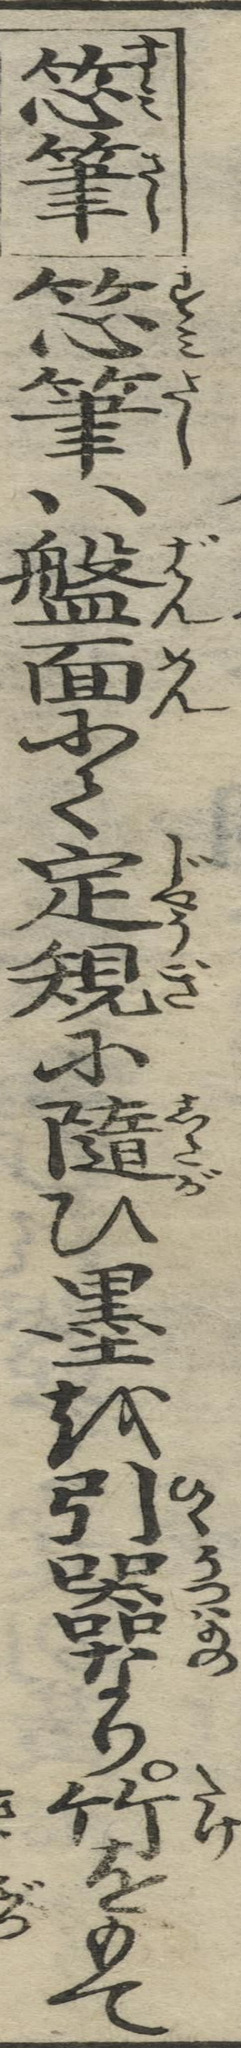芯筆芯筆は盤面にて定規に随ひ墨を引器なり。竹をもて
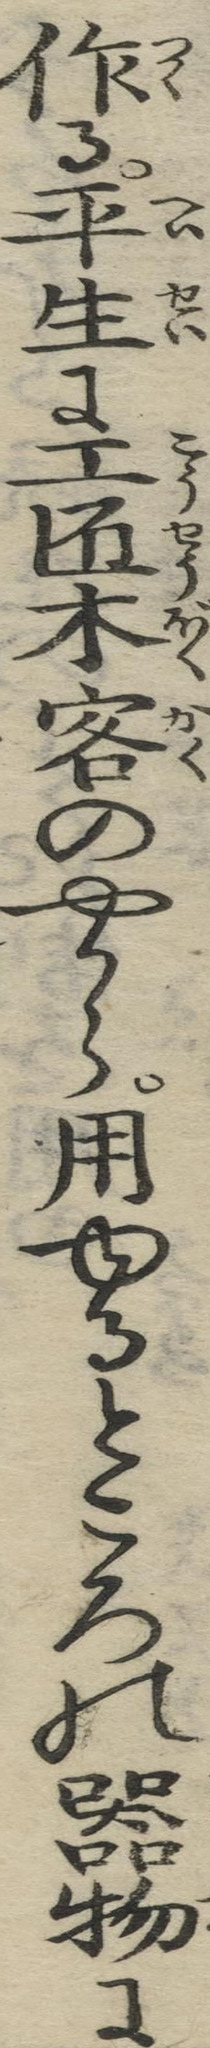作る。平生に工匠木客のやから。用ゆるところの器物に
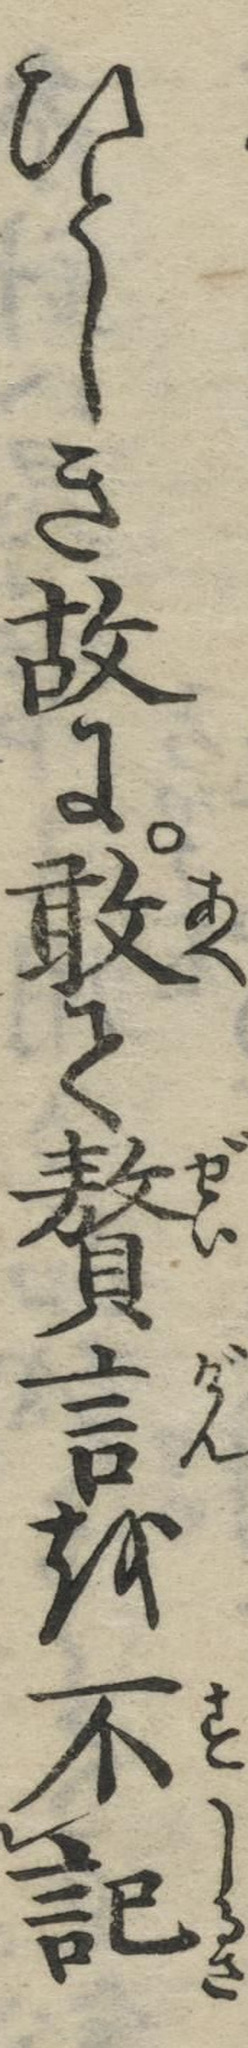ひとしき故に。敢て贅言を不記
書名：量地指南　巻之一（内題）
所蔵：東京大学地震研究所図書室 Earthquake Research Institute Library, The University of Tokyo, JAPAN
